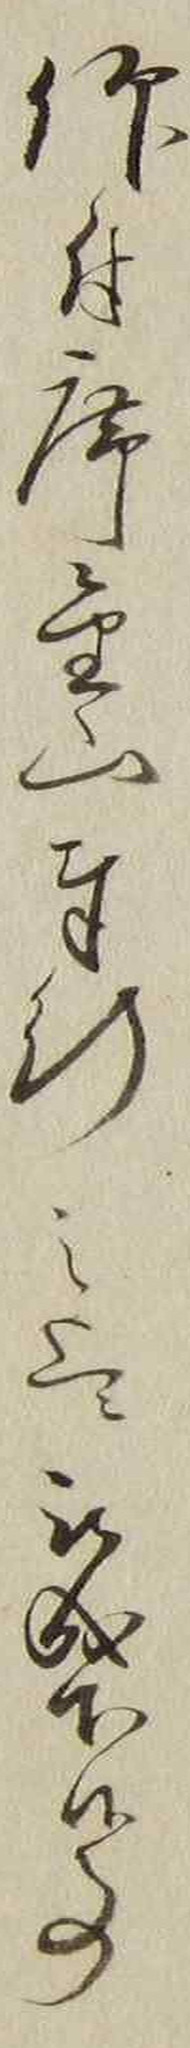仰付席金山奉行之上ニ被成下候事
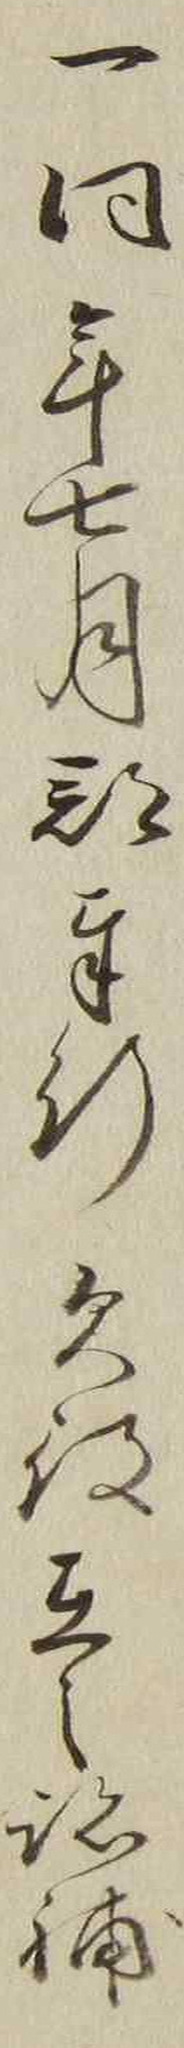一同年七月郡奉行欠役在之跡補

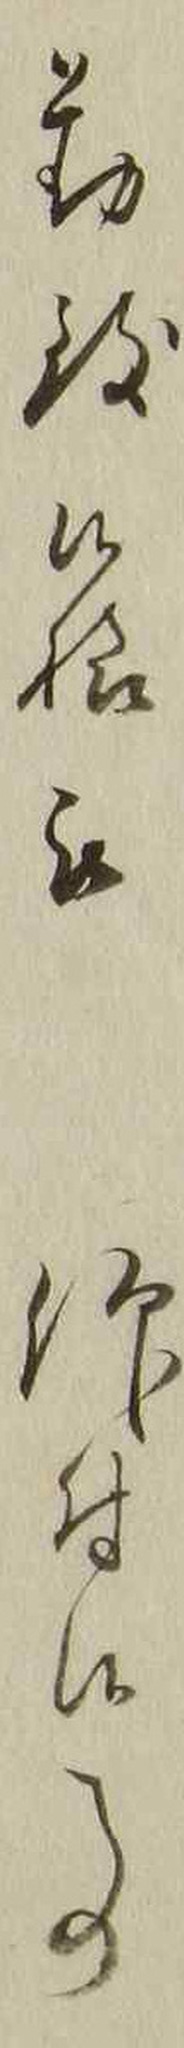勤致候様被仰付候事
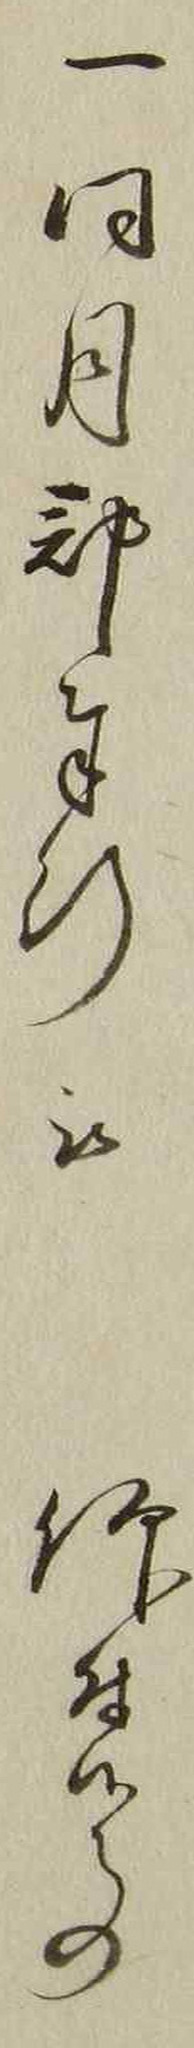一同月郡奉行被仰付候事
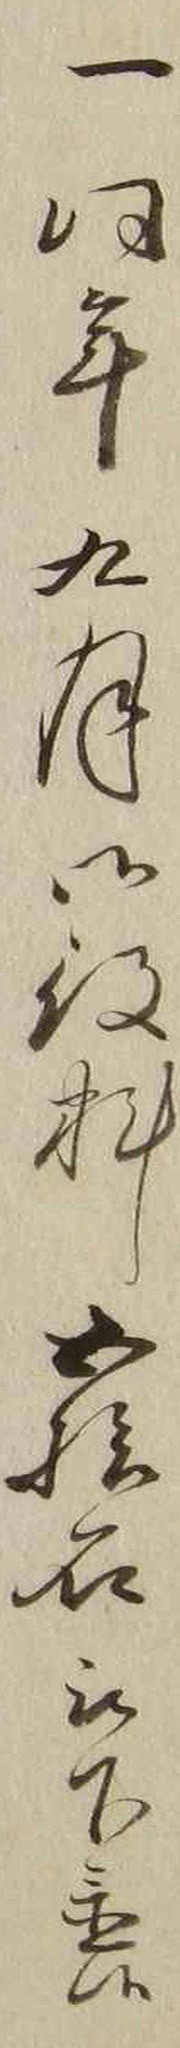一同年九月御役料五拾石被下置候
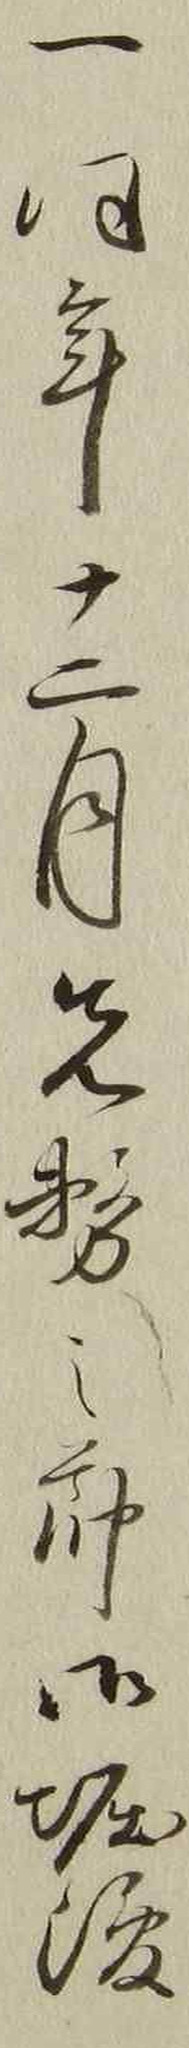一同年十二月先務之節御堀浚
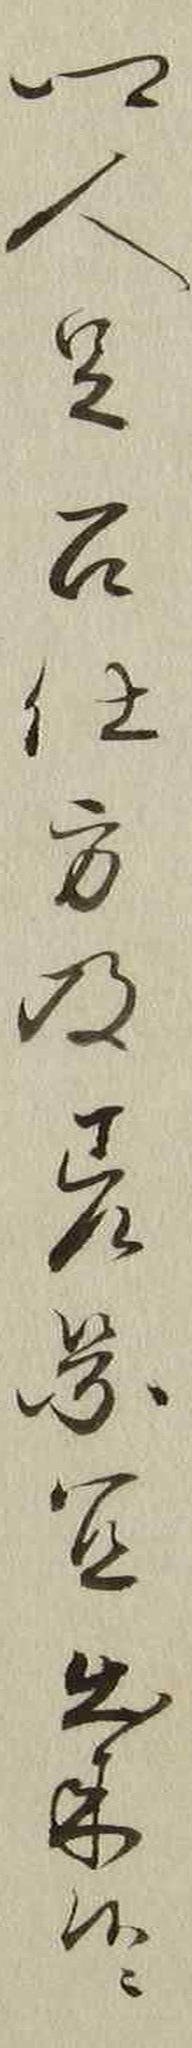郷人足召仕方及差図宜出来候ニ
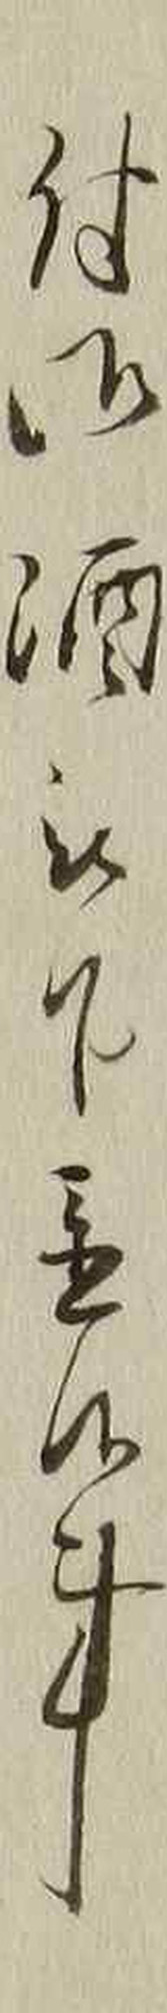付御酒被下置候事
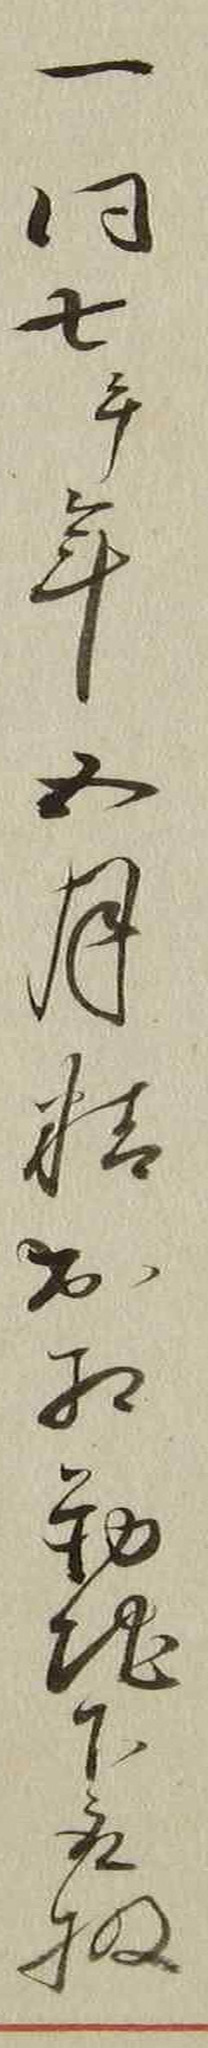一同七午年五月精出相勤地下取扱
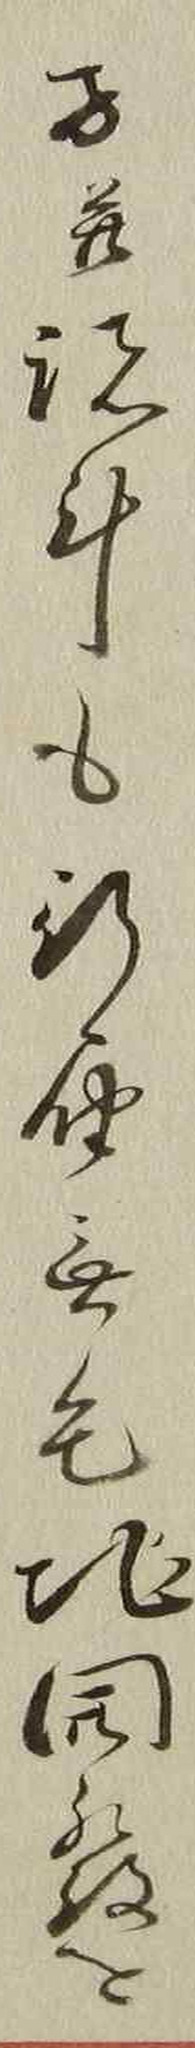方幷諸計も行届無毛地開発を
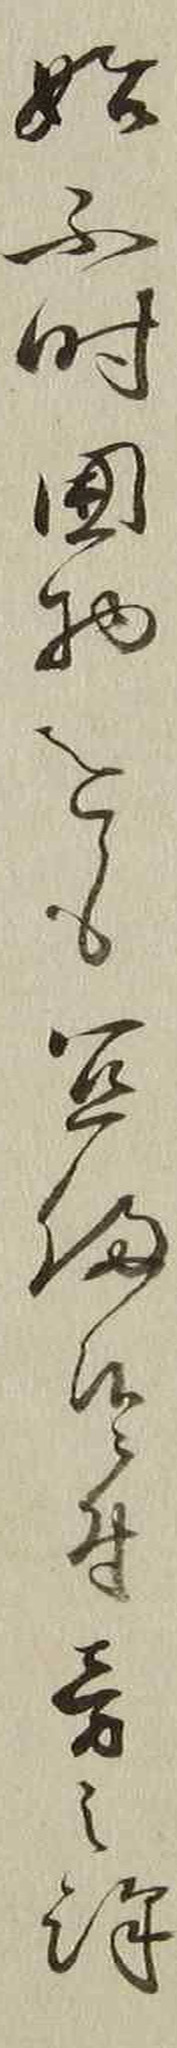始不時囲物をも宜備候ニ付旁之訳
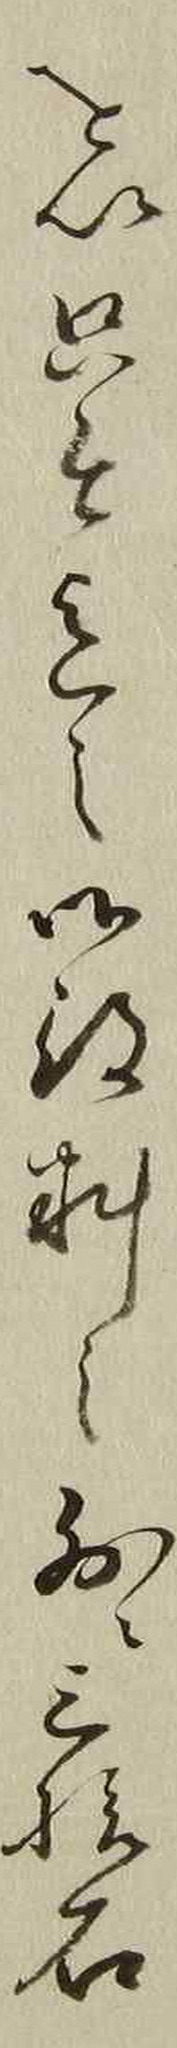を以只今迄之御役料之外ニ三拾石
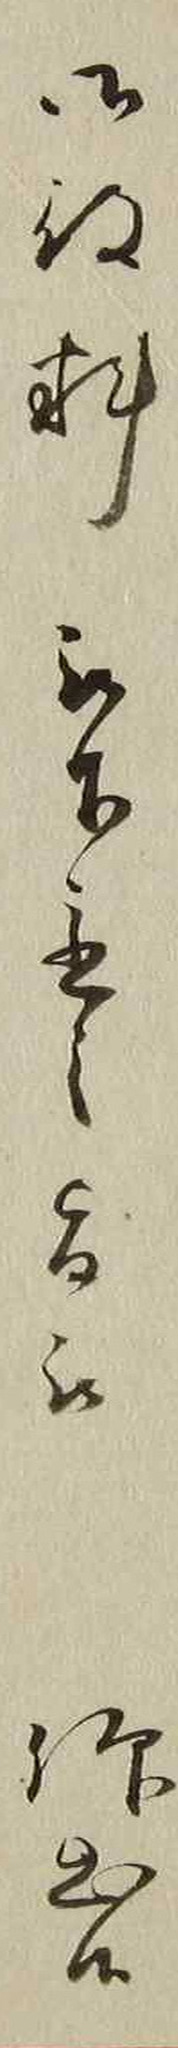御役料被下置之旨被仰出候
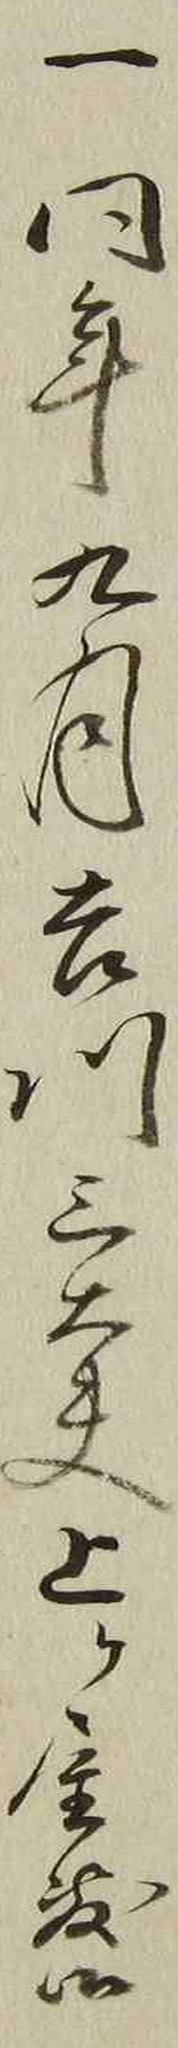一同年九月吉川三大夫上ケ屋敷御
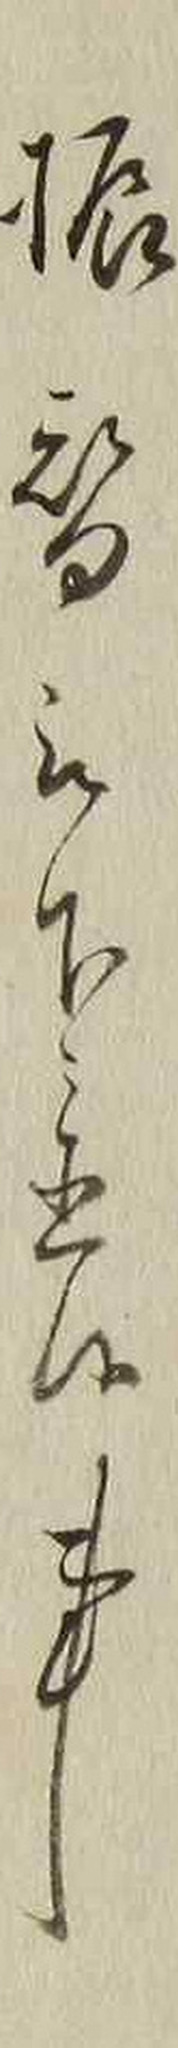振替被下置候事
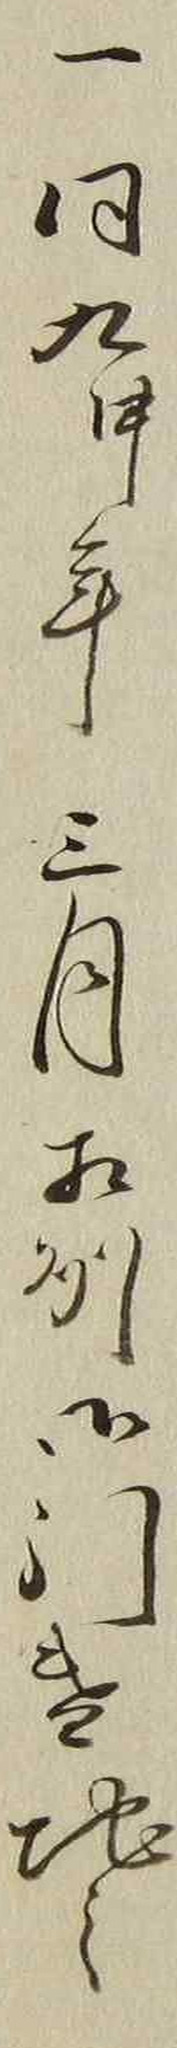一同九申年三月相州御引替地之
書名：諸士系譜　巻之52　に之部3
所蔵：会津若松市立会津図書館
